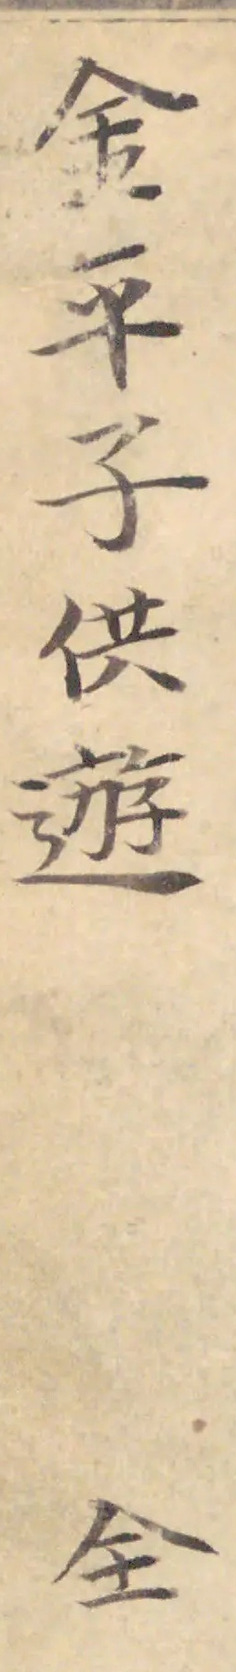金平子供遊全

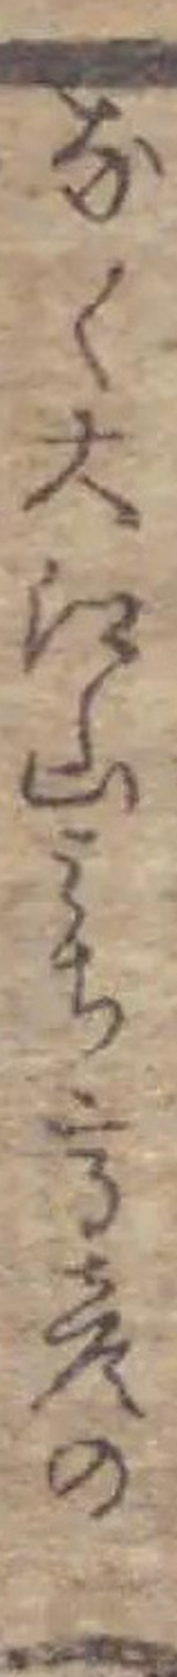なく大江山みち高彦の
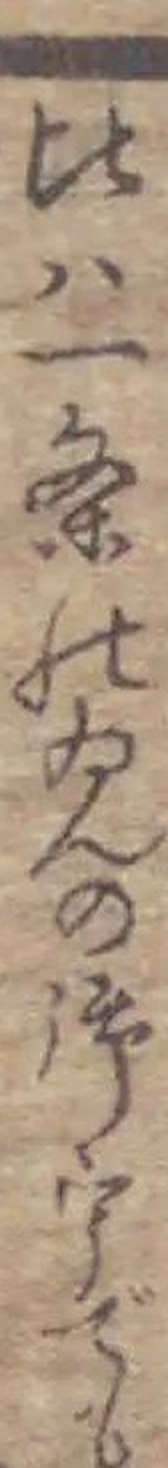比は一条のゐんの御宇でも

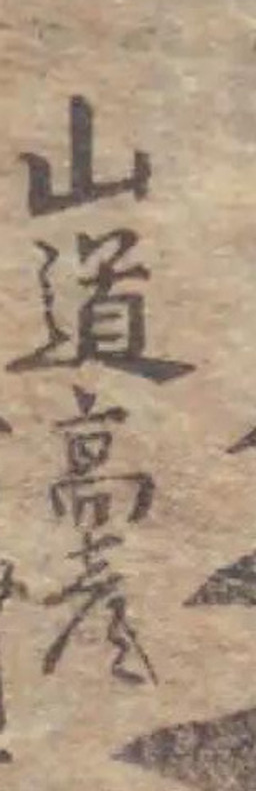山道高彦
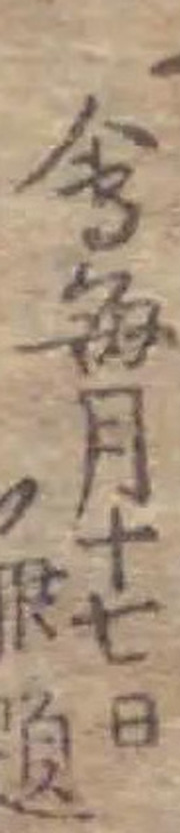会毎月十七日
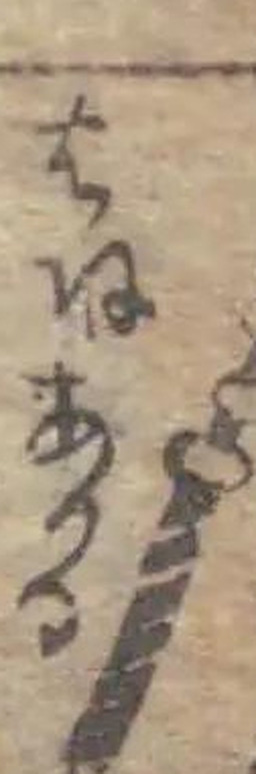はねあかる
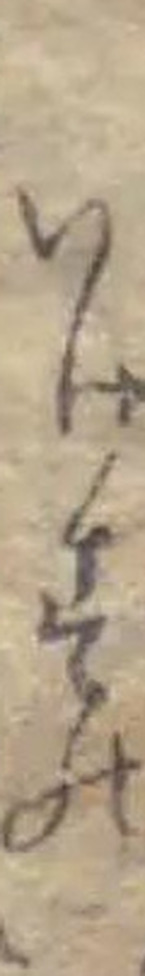いけすの
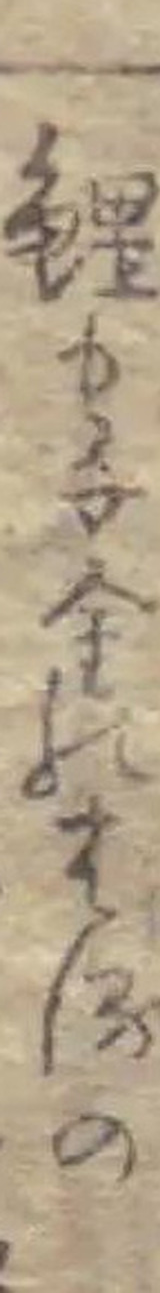鯉も千金のはるの
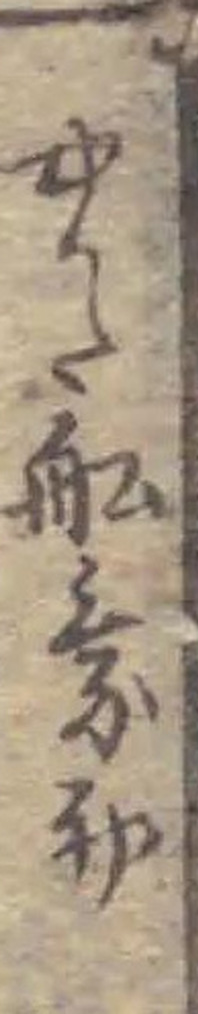やかた船乗初
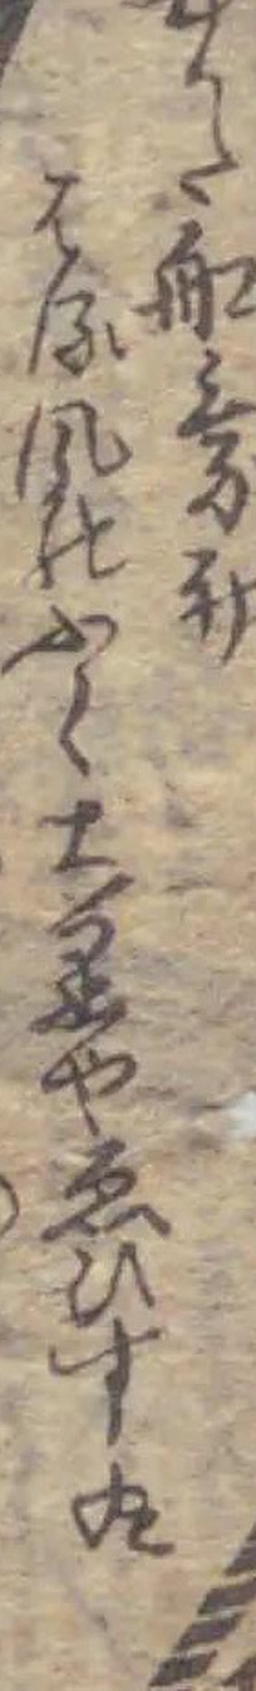はるかぜのふく大黒やえひす丸

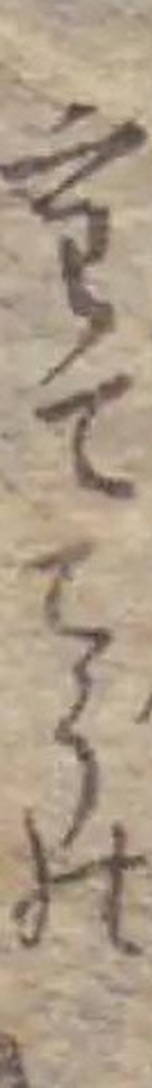重ててうの
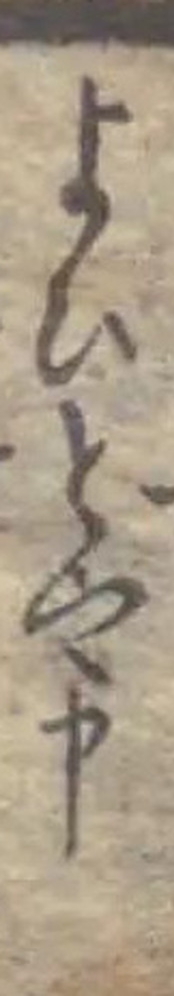よひとや申
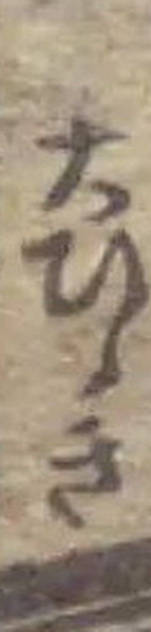大ひゝき
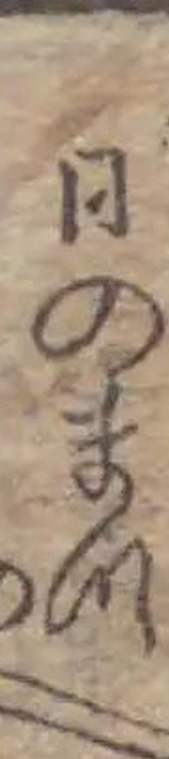日のまつ
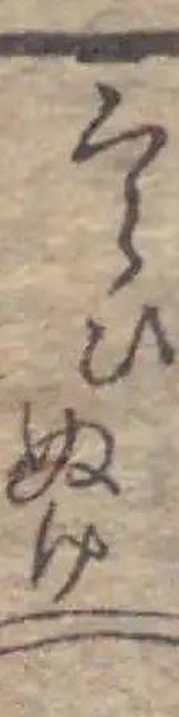くらひぬけ
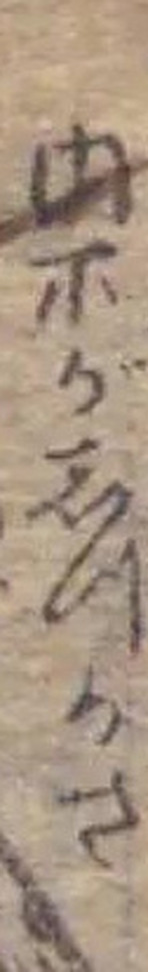内所がしつかさ
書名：金平子供遊 2巻
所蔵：国立国会図書館 National Diet Library, JAPAN
